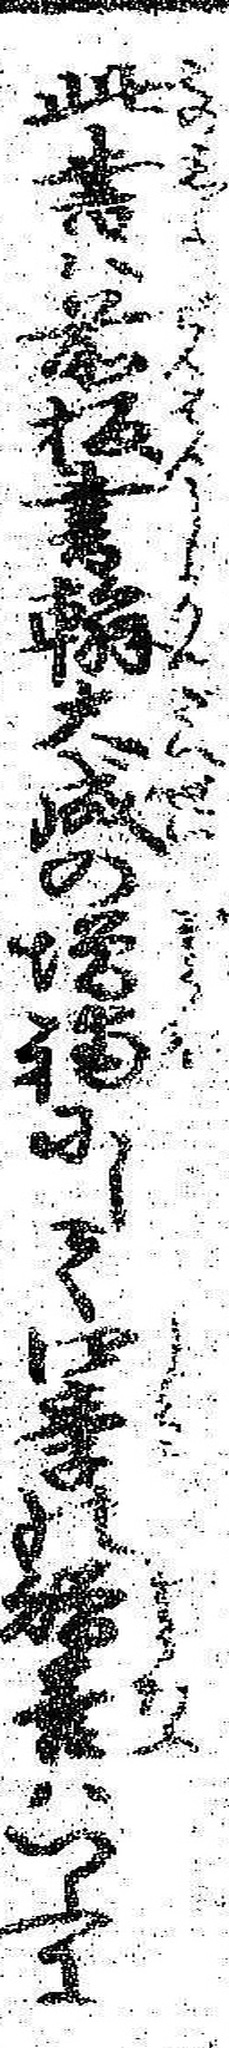此書は前板書翰大成の増補にして四季の贈答はいふに
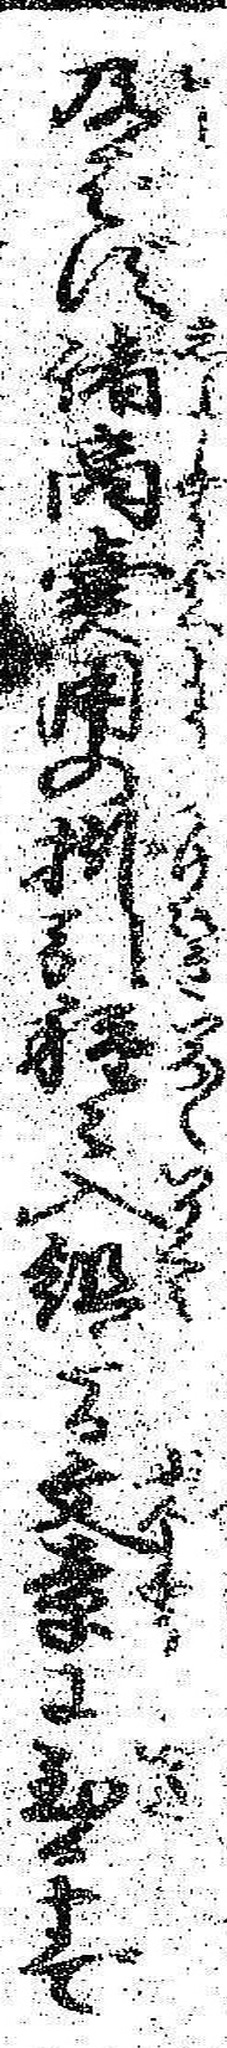及ばず諸商売用の掛引種々入組たる文章に至るまで
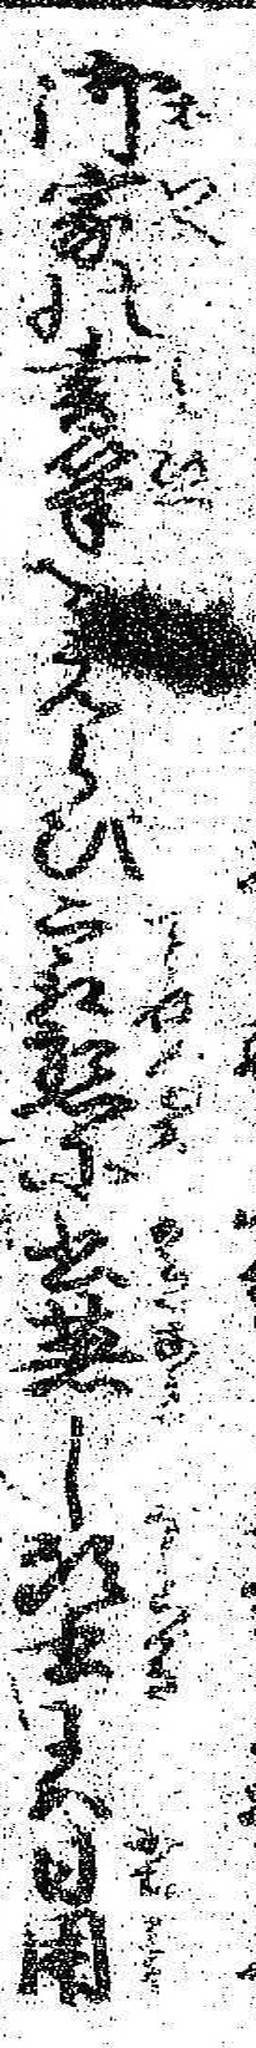御家の書筆をえらひ之取懇に書著し頭書には日用
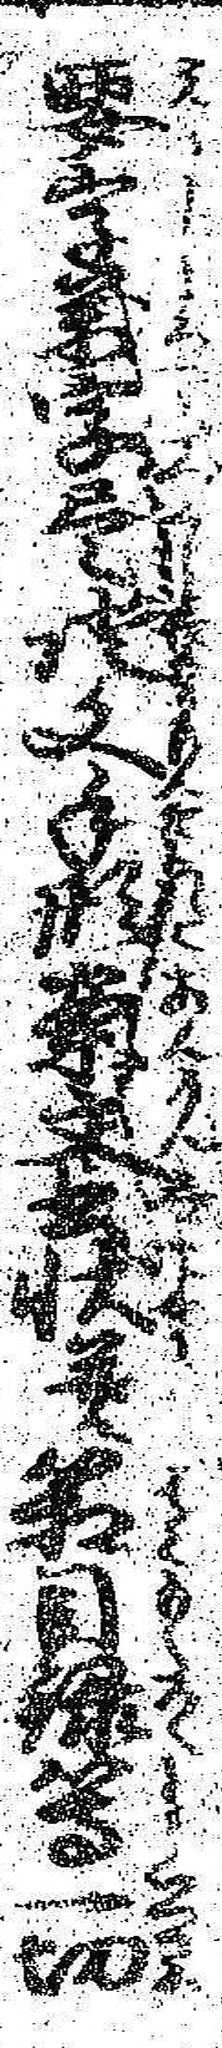要字万字尽証文手形案文書状并箱目録等一切
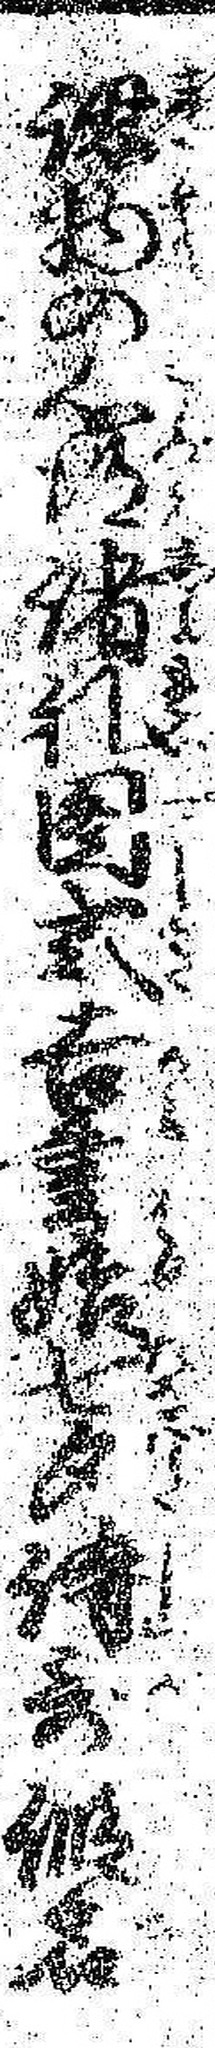纏物の心得諸礼図式吉書始七夕詩歌仮名
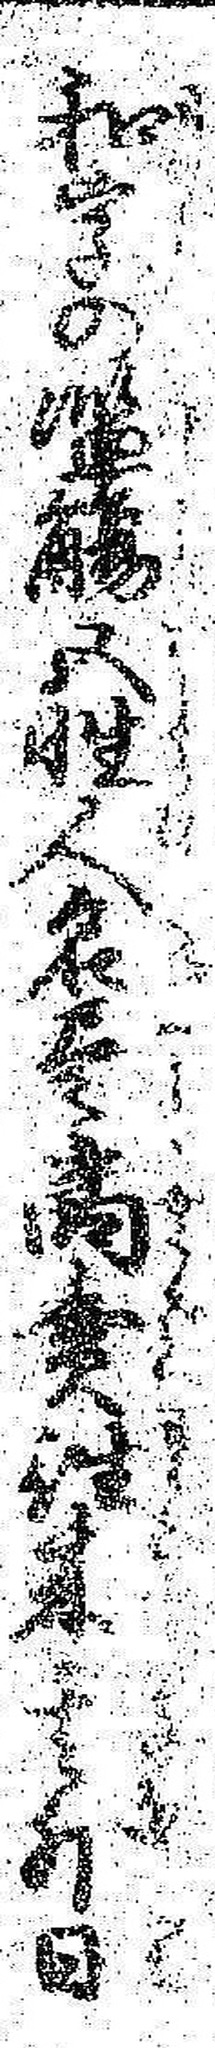和字の濫觴五性人名尽商売往来其外日
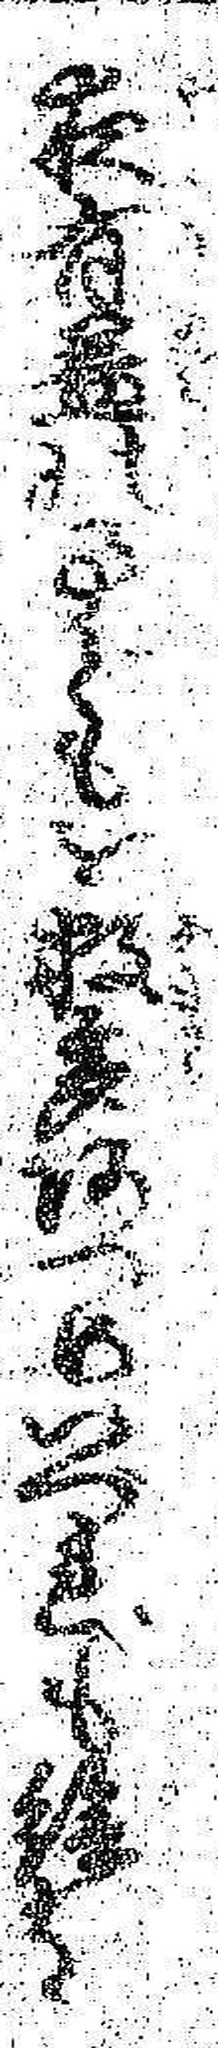夜有益の事どもを数多あつめいつれも絵を
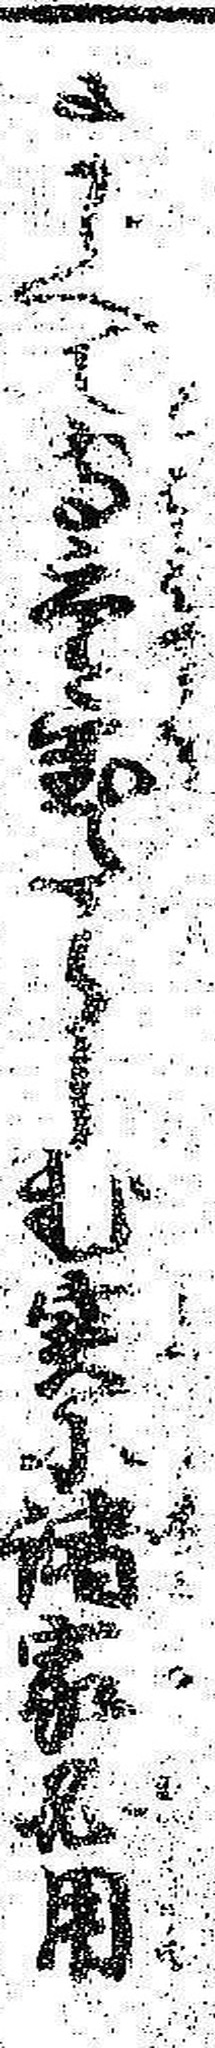まじへて専重宝たらしむ実に諸家必用
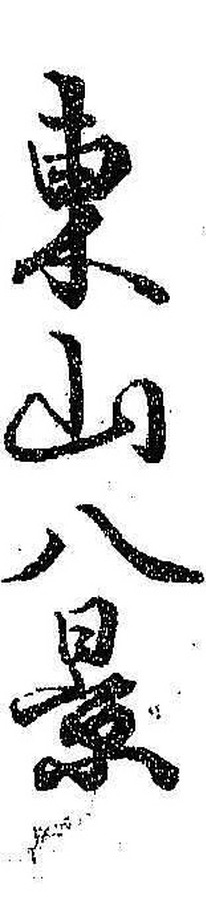東山八景
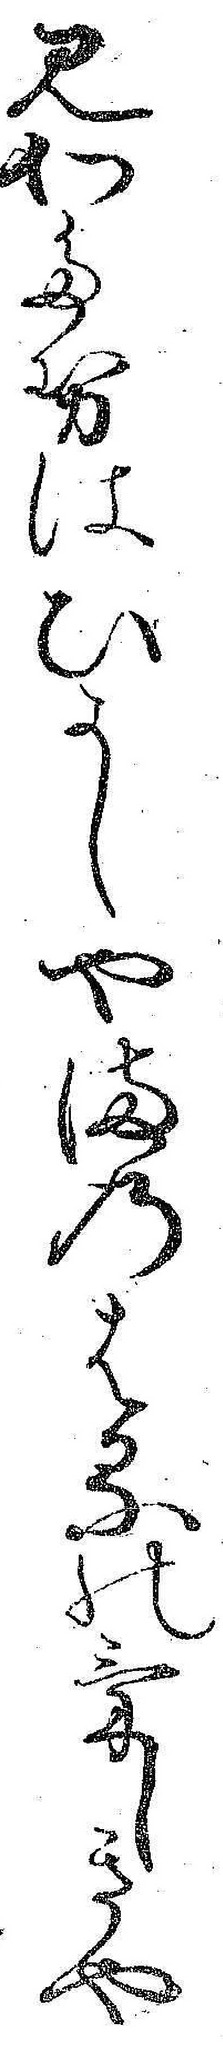みわたせはひかしやまのはるのけしきや
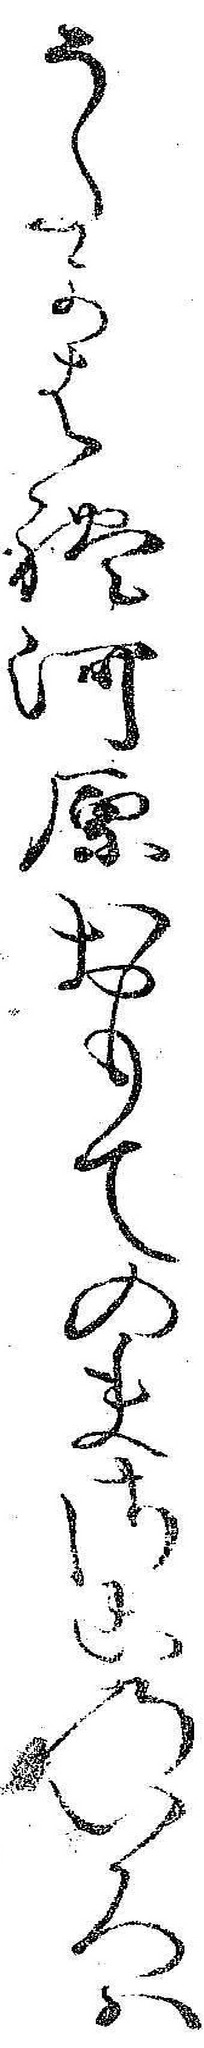うたかはれ河原おもてのまさこのいろは
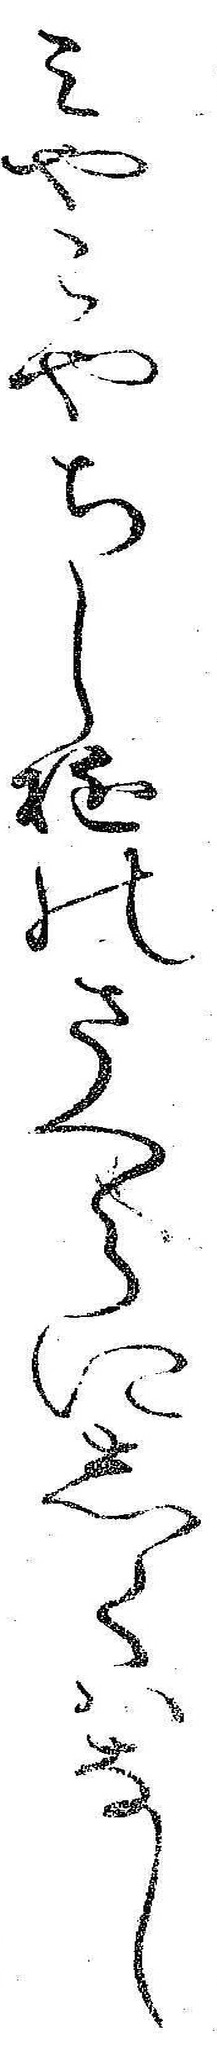みやこやちしゆのさくらにしくはなし
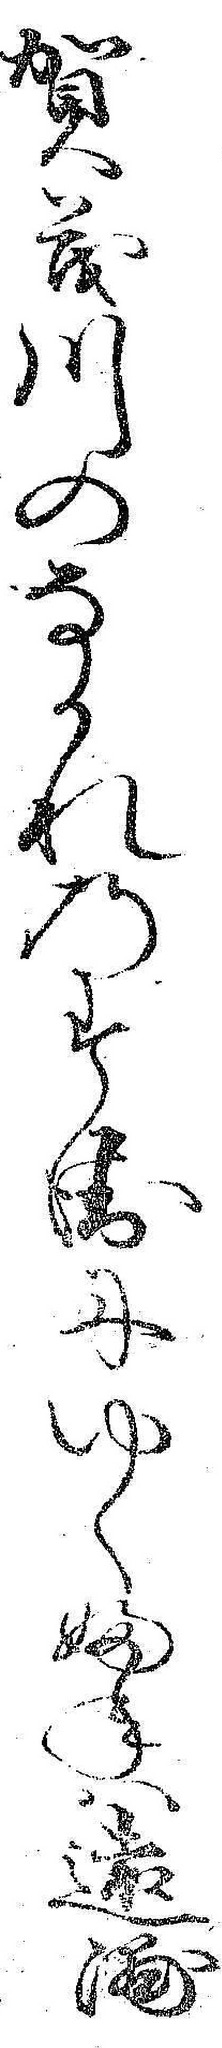賀茂川のなかれのすゑにゆくふねは遠浦
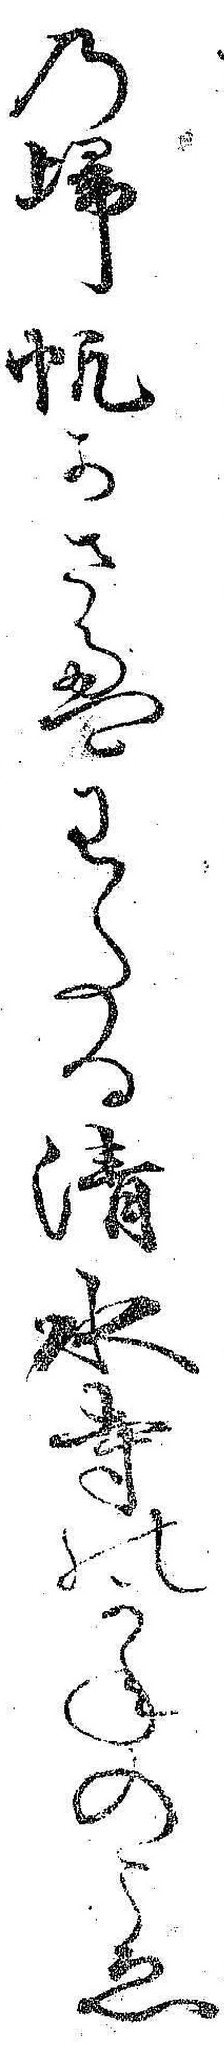の帰帆かさえわたる清水寺のかねのこゑ

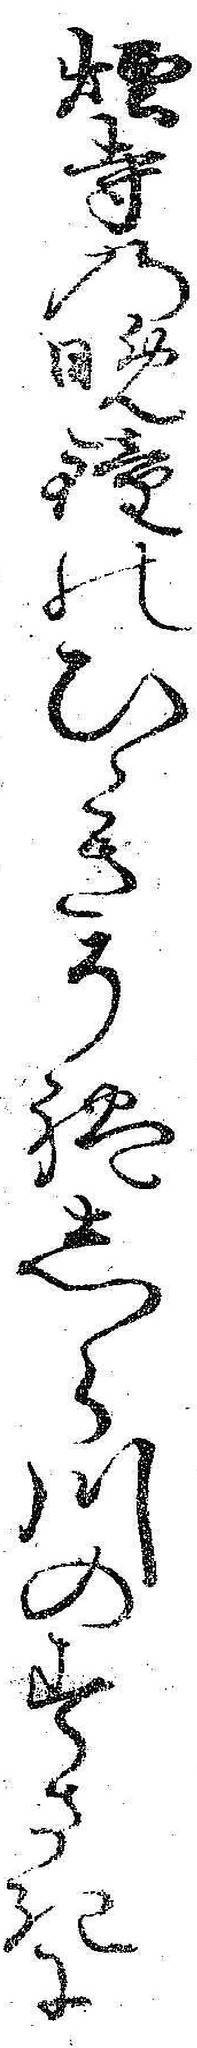煙寺の晩鐘のひゝきそれしら川のすさきに
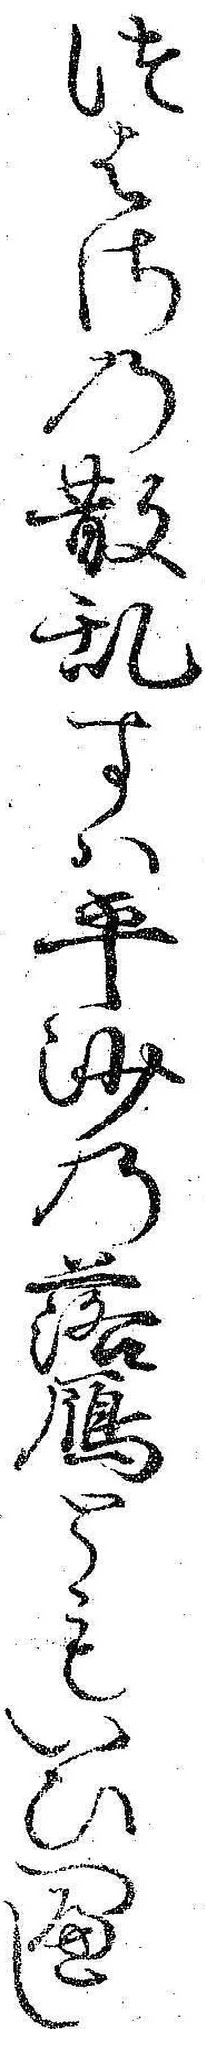つはさの散乱すは平沙の落雁ともひつへし
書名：昔話稲妻表紙
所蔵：国文学研究資料館
